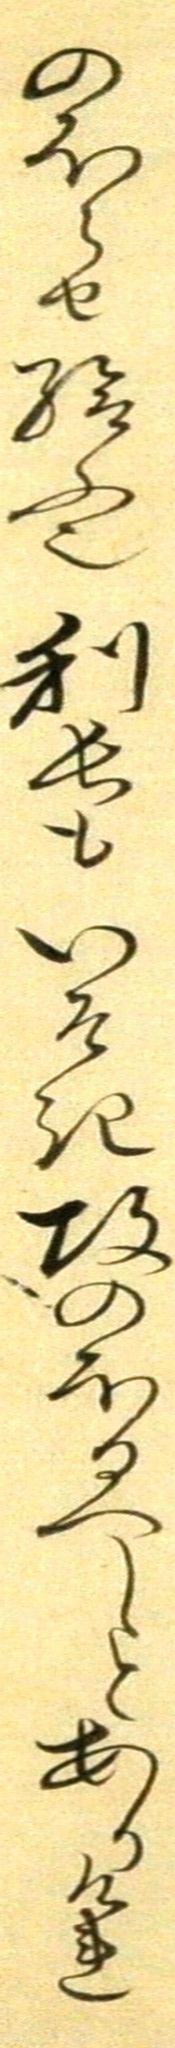のほらせ給ふ也利長もいそき攻のほるへしとありけれ
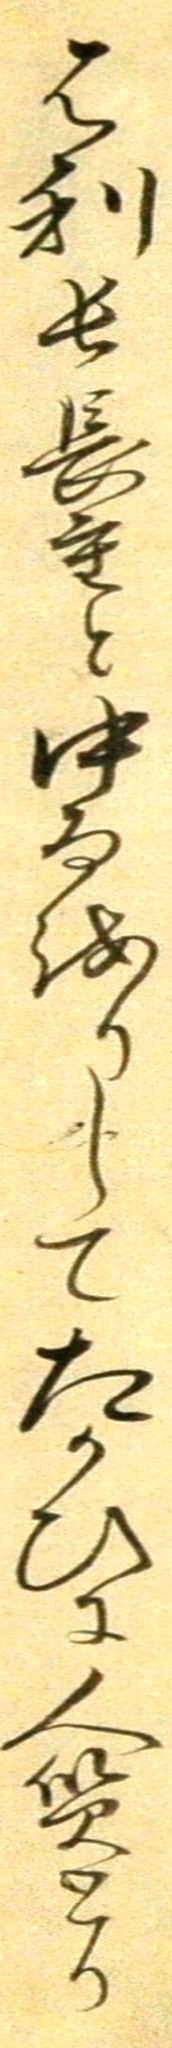は利長長重と中なをりしてたかひに人質とり

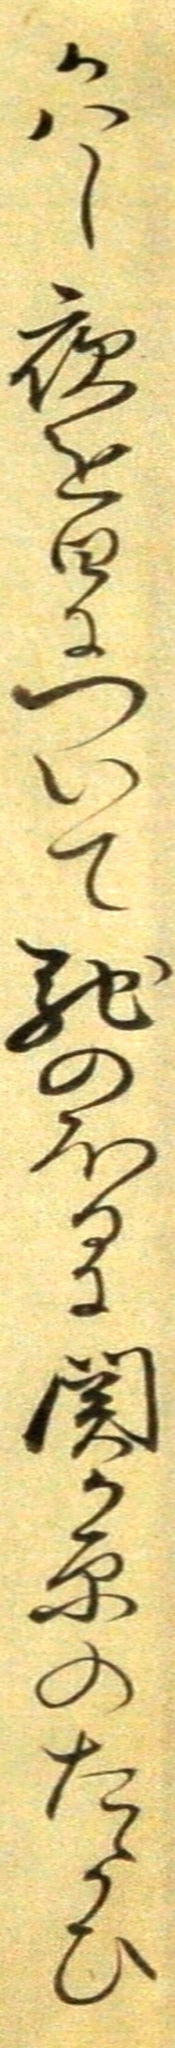かはし夜を日について馳のほるに関か原のたゝかひ
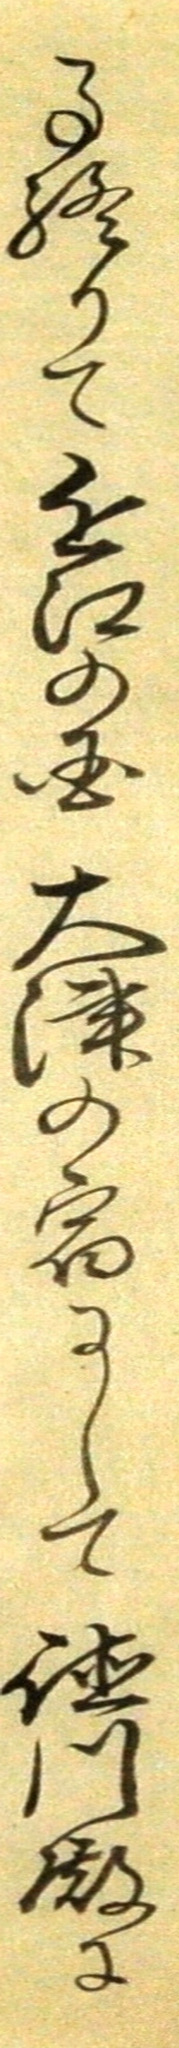事終りて近江の国大津の宿にして徳川殿に
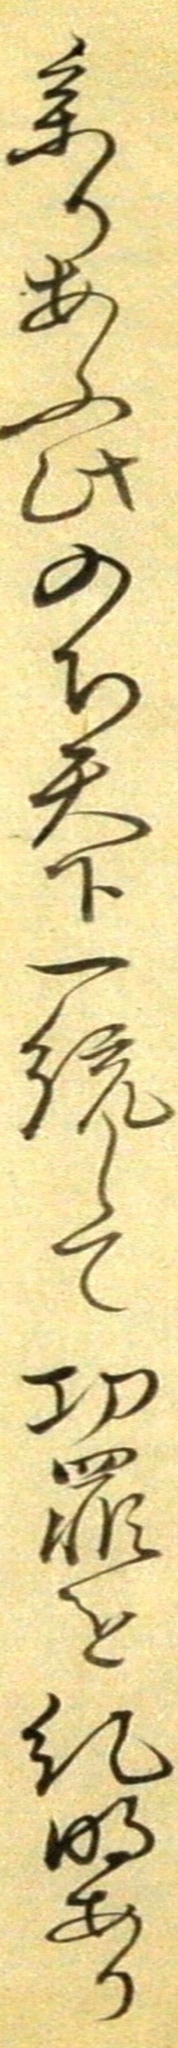参りあふ此のち天下一統して功罪を糺明あり
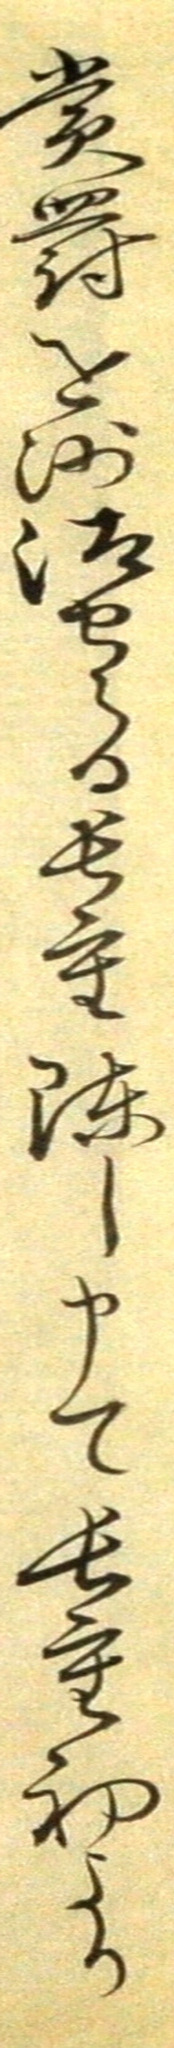賞罰を沙汰せらる長重陳し申て長重初より
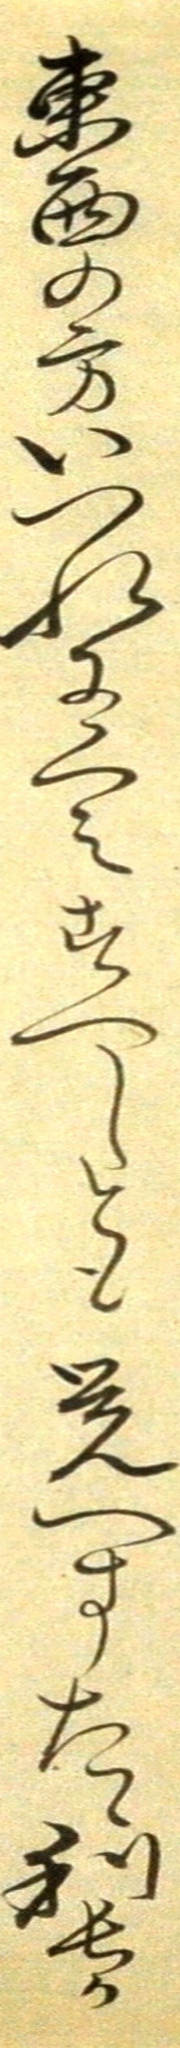東西の方いつれにくみすへしとも覚へすたゝ利長か
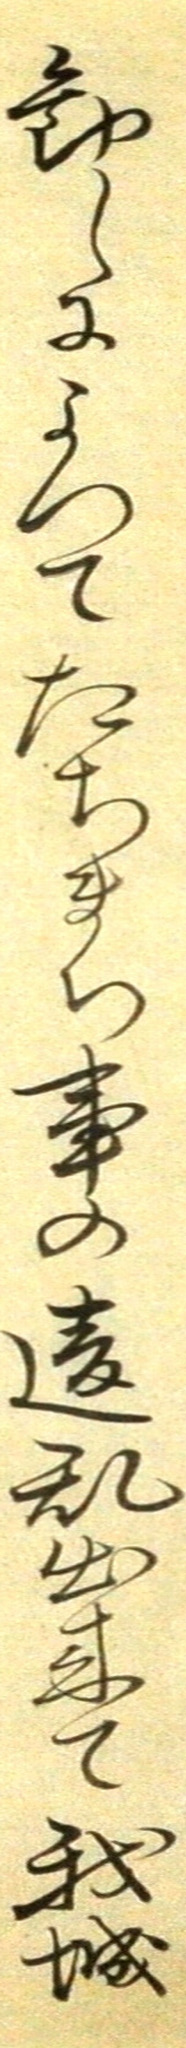勧しによつてたちまち事の違乱出来て我城
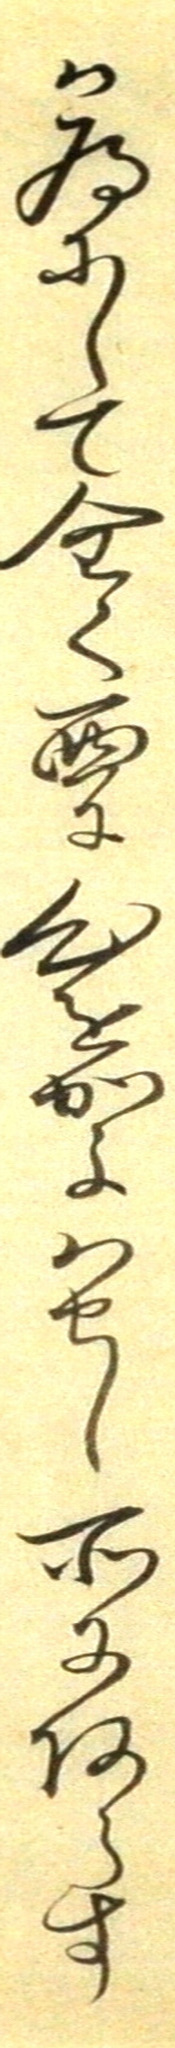か為にして全く西に心をかよはせし所にあらす
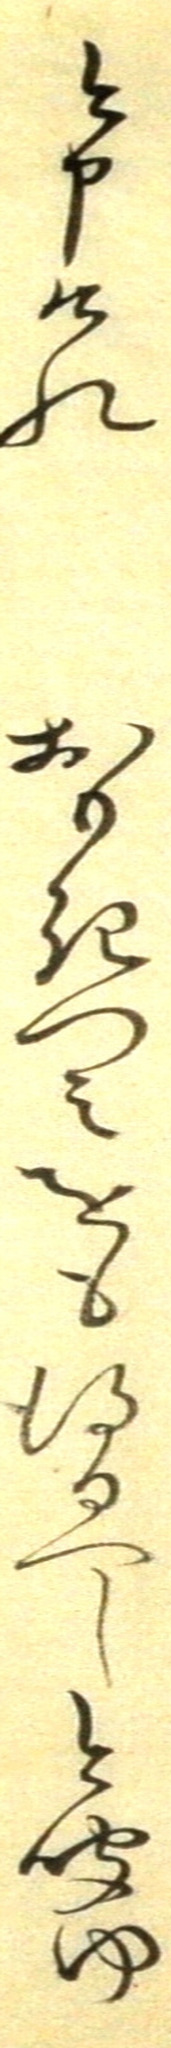と申けれおもきつみをも得るへしと聞ゆ
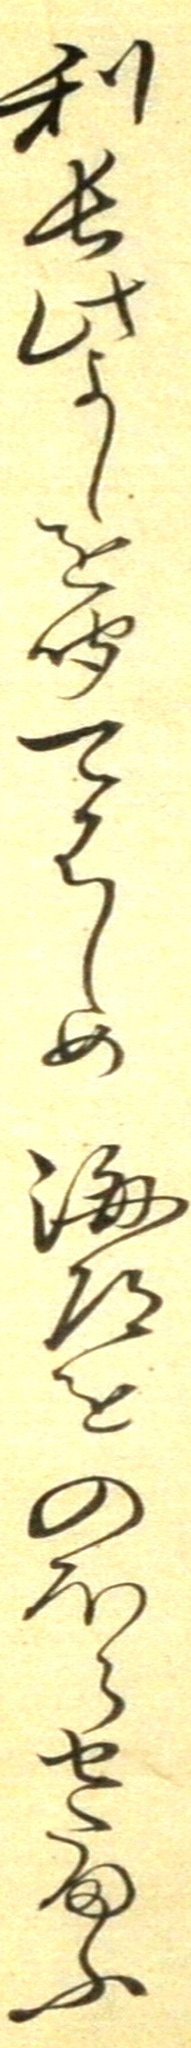利長此よしを聞てはしめ海道をのほらせたまふ
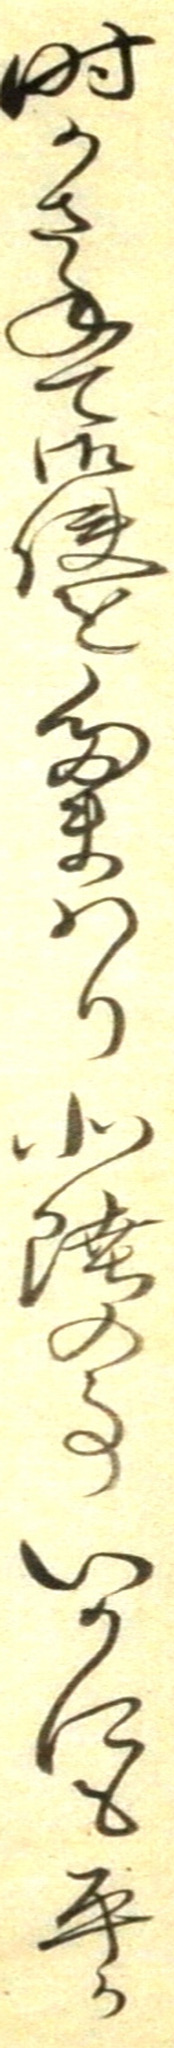時かさねて御使をたまはり北陸の事いかにも平か
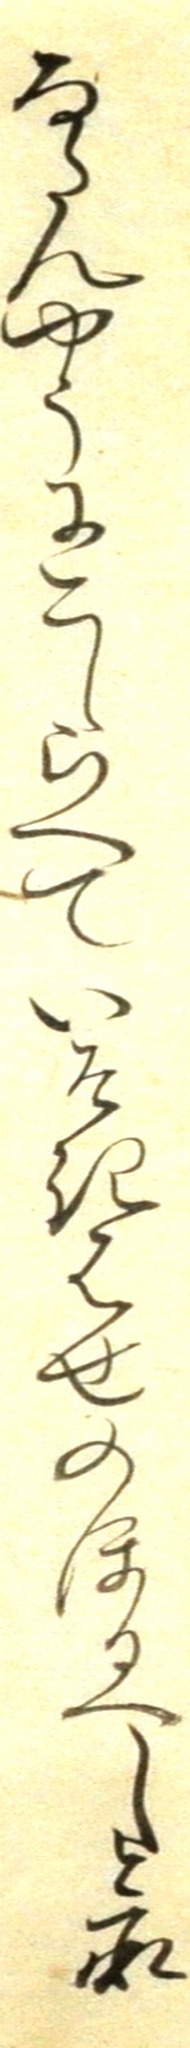ならんやうにこしらへていそきはせのほるへしと承
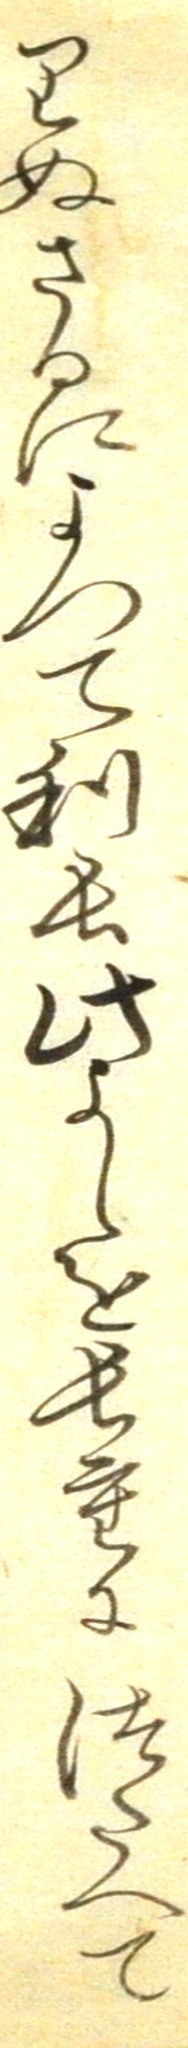りぬさるによつて利長此よしを長重につたへて
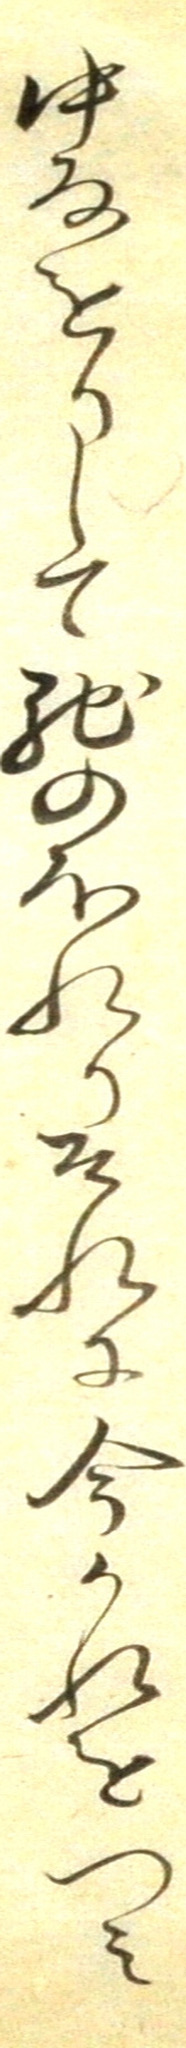中なをりして馳のほれりそれに今かれをつみ
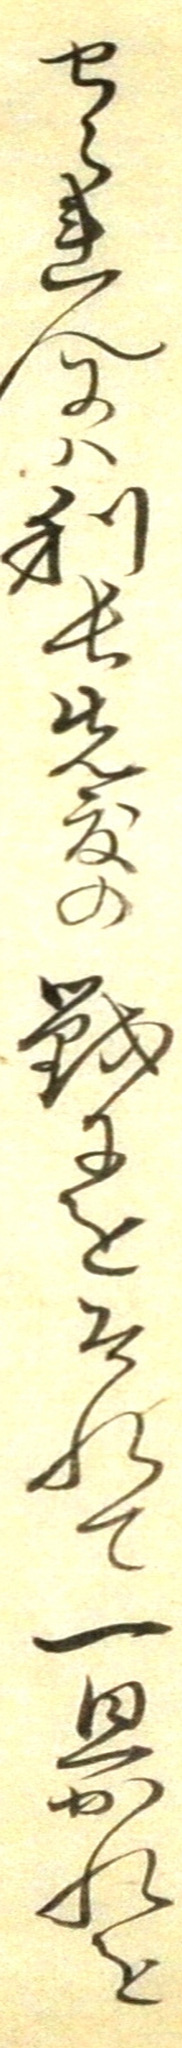せられんには利長先度の戦にをそれて一旦かれを
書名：藩翰譜（八・下）
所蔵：伊那市立高遠町図書館・合同会社AMANE
